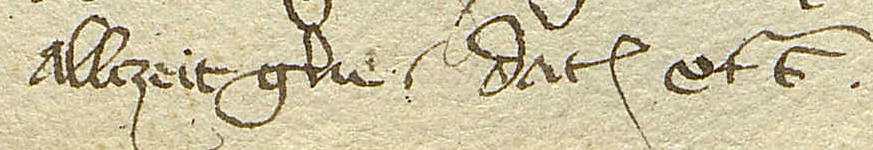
allcʒeit g*ne / Dat* vts* .
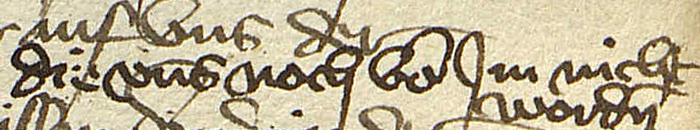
die vns noch vo* Im nicht
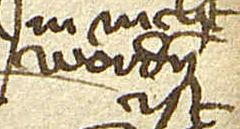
wordn*
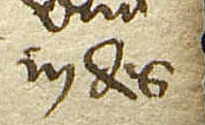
in des
